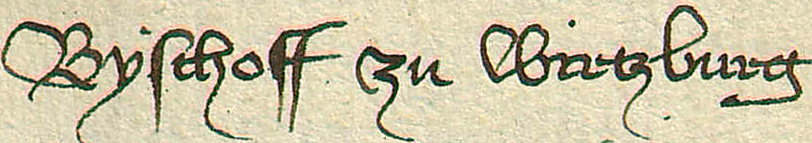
Byſchoff cʒu wircʒburg
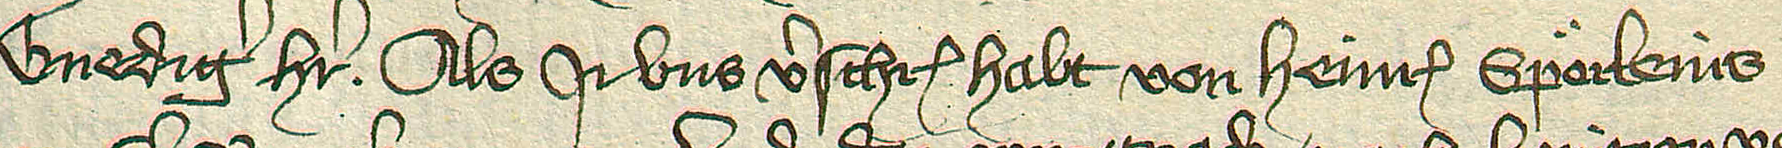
Gnedig* hr* . Als Ir vns v*ſchr* habt von heinr* Spörleins
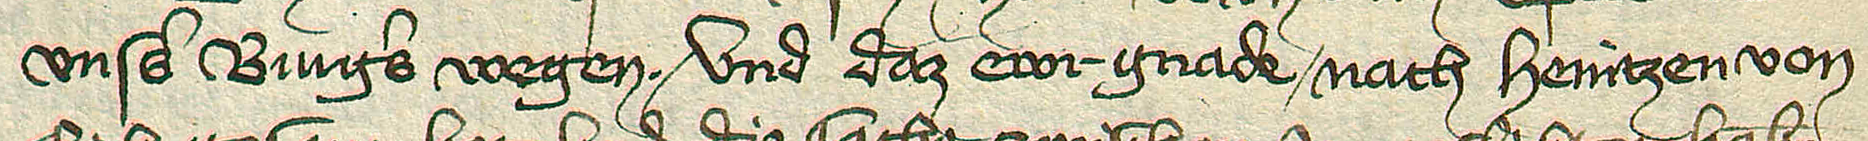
vnſs* Burgs* wegen . / Vnd daʒ ewr gnade / nach Heincʒen von
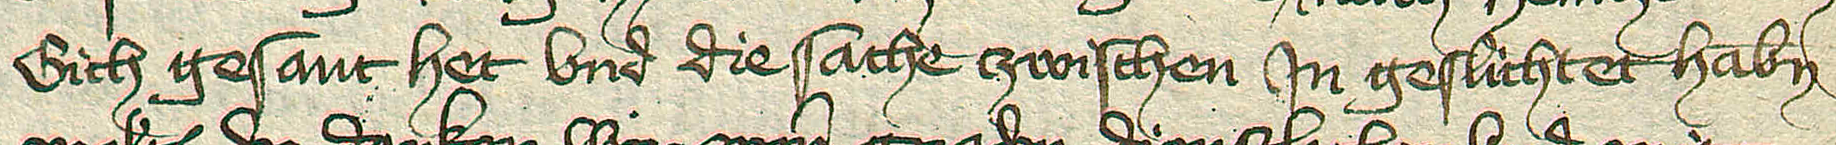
Gich geſant het vnd die ſache cʒwiſchen In geſlichtet habn*
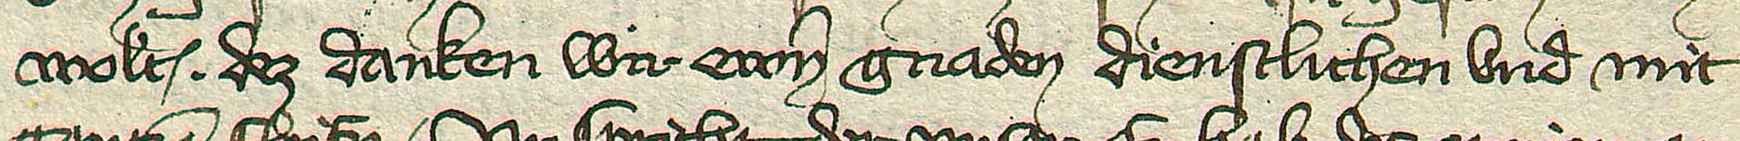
wolt / . daʒ danken wir ewn* gnaden dienſtlichen vnd mit
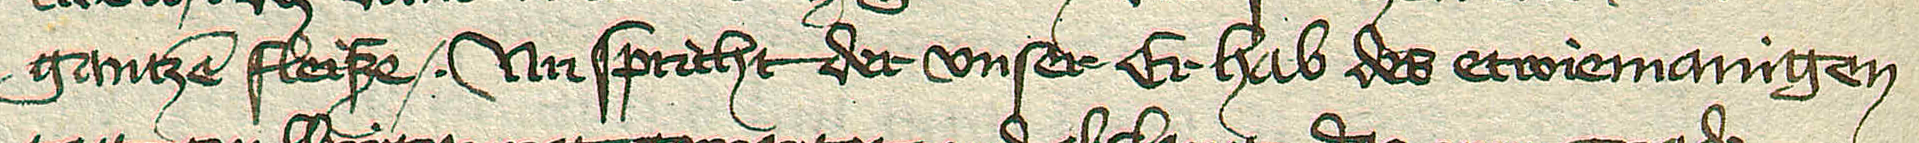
gancʒe* fleiſʒe / . Nu ſpricht der vnſer Er hab des etwiemanigen
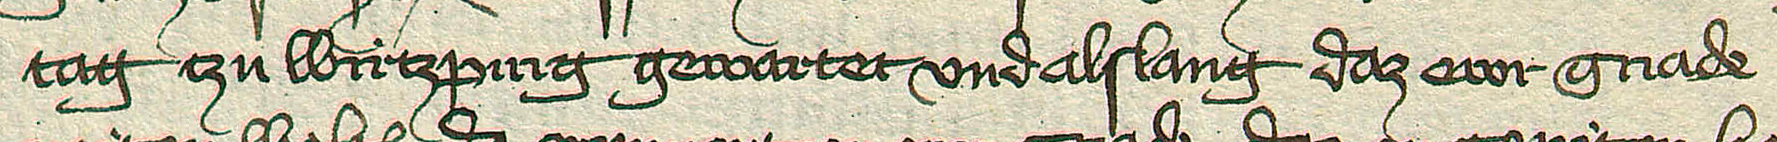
tag cʒu wircʒpurg gewartet vnd alſlang daʒ ewr gnade
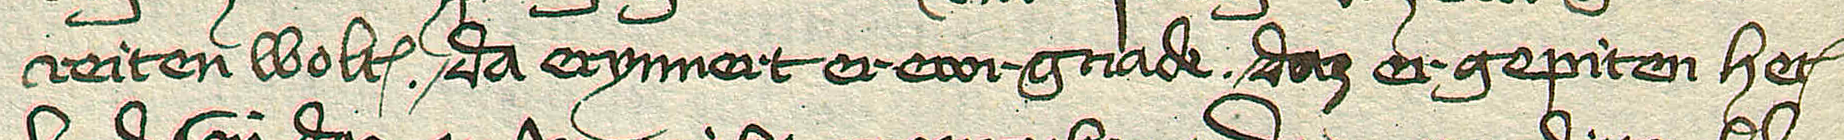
reiten wolt* . / da erynnert er ewr gnade . / daʒ er gepiten het*
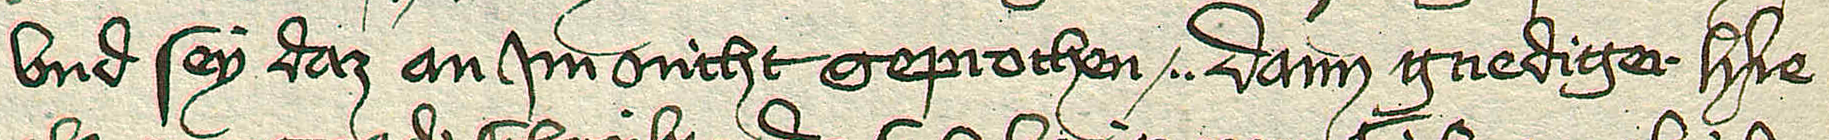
vnd ſey daʒ an Im nicht geprochen / ~ dann gnediger h*re
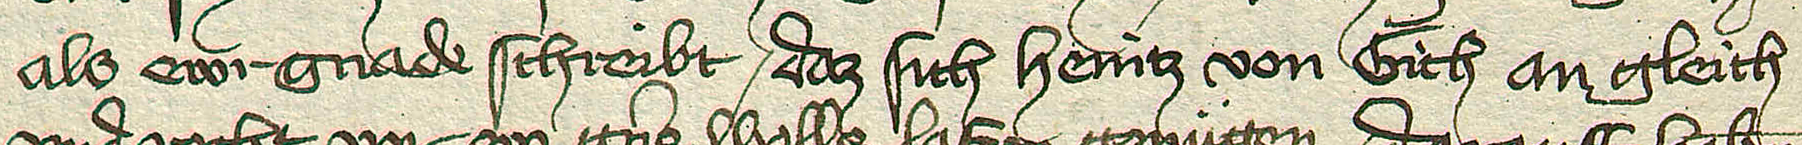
als ewr gnade ſchreibt / daʒ ſich heincʒ von Gich an gleich
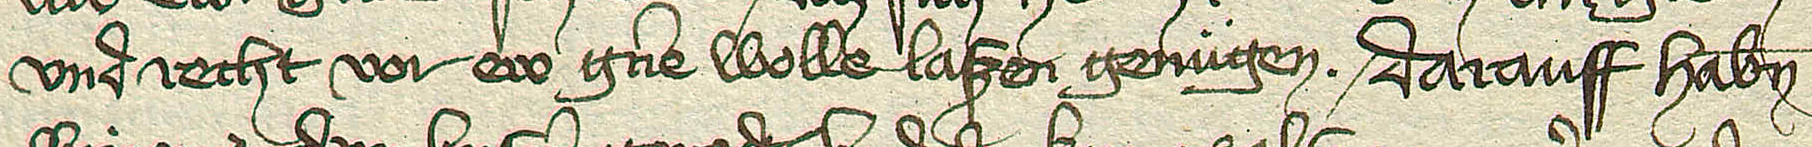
vnd recht vor ew g*ne wolle laſʒen genügen . / darauff habn*
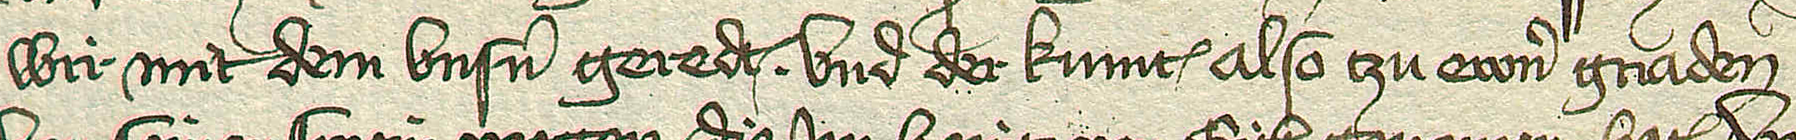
wir mir dem vnſn* geredt / . vnd der kumt* alſo cʒu ewn* gnaden
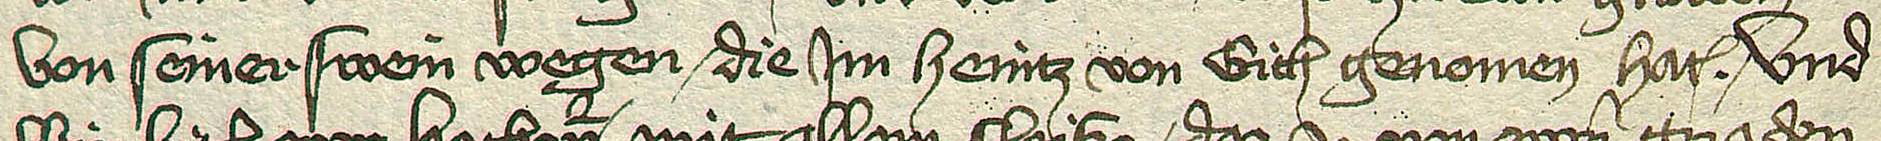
von ſeiner ſwein wegen / die Im heincʒ von Gich genomen hat* . / Vnd
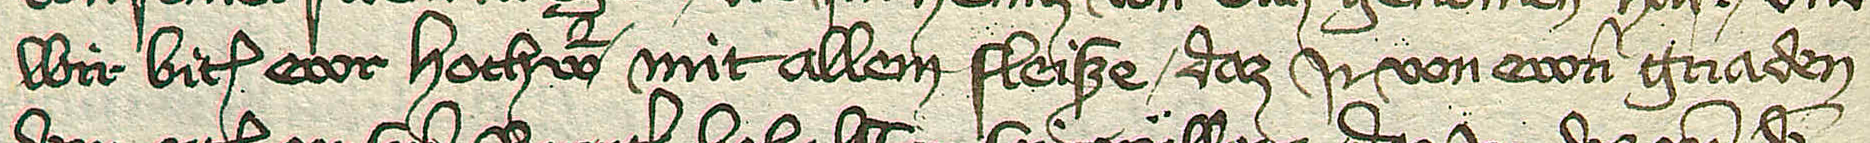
wir bit* ewr hochw* mit allen fleiſʒe / daʒ Ir von ewn* gnaden
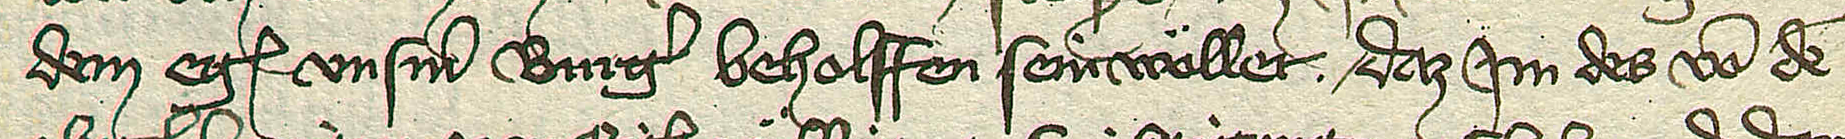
dem eg* vnſm* Burg* beholffen ſein wöllet . / daʒ Im des vo* de*
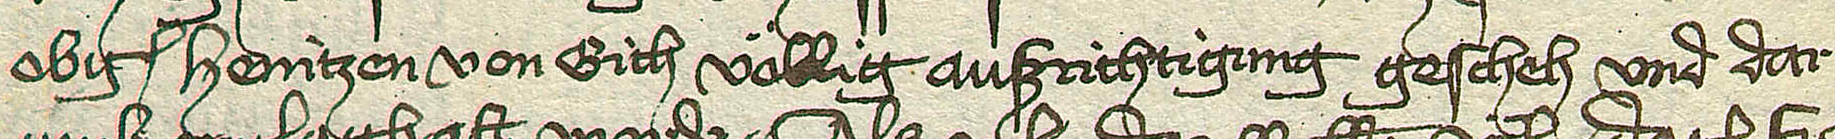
obg* Heincʒen von Gich völlig auſʒrichtigung geſcheh vnd dar
